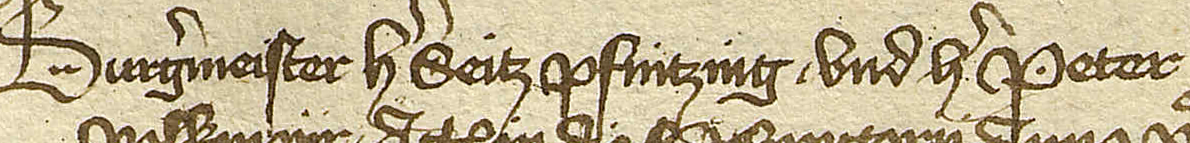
Burg*meiſter h* Seitʒ Pfintʒing / vnd h* Peter
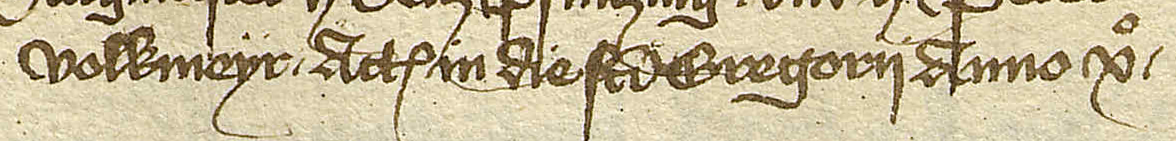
volkmeyr / Act* in die ſci* Gregorii Anno x* /
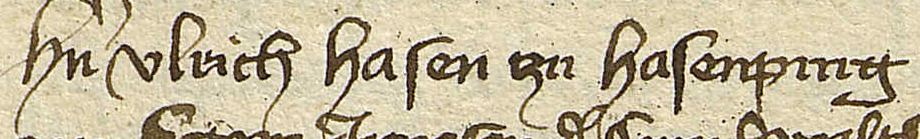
hn* vlrich haſen cʒu haſenpurg
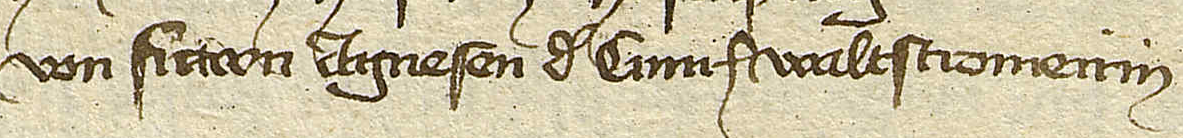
von frawn Agneſen d* Cunr* waltſtromeirin
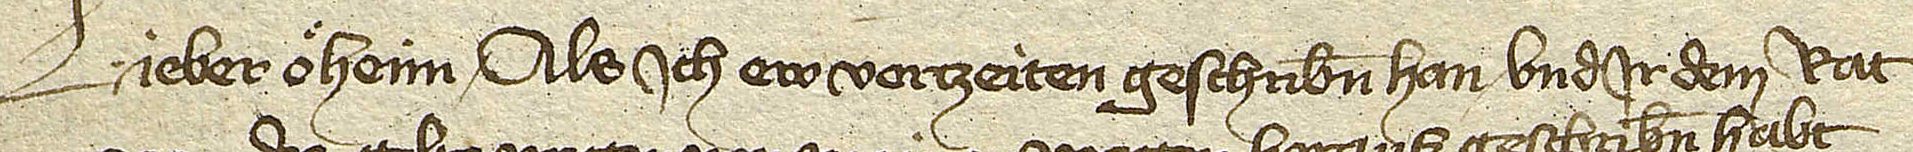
Lieber öheim / Als Ich ew vorcʒeiten geſchribn* han / vnd Ir dem Rat
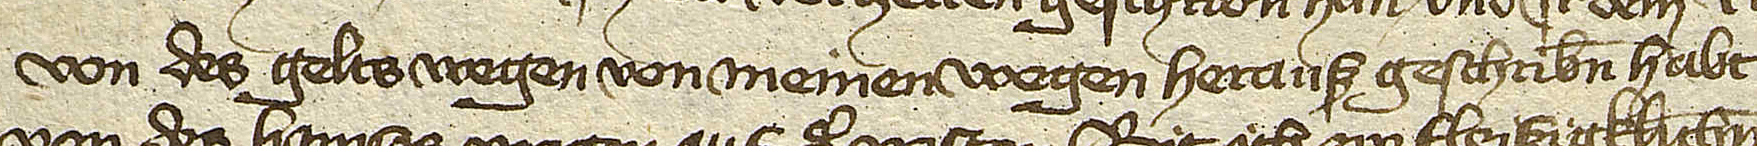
von des gelts wegen von meinen wegen herauſʒ geſchribn* habt
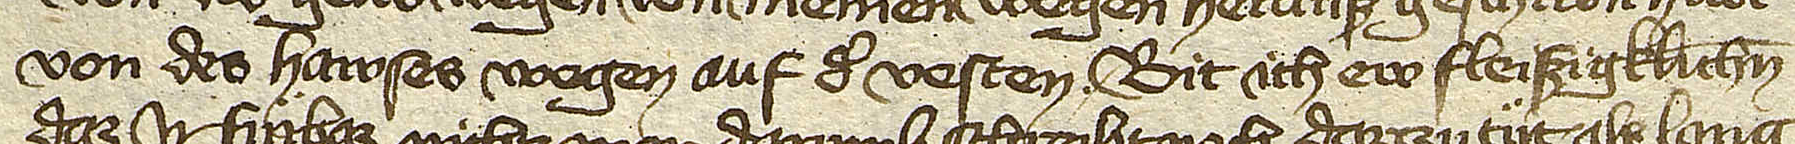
von des hawſes wegen auf d* veſten . / Bit ich ew fleiſʒigklichn*
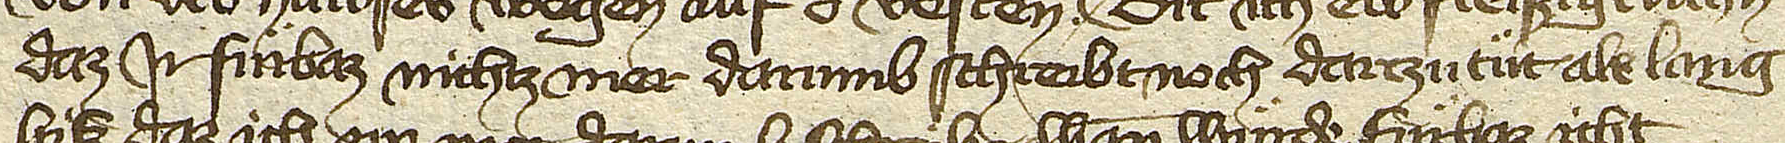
daʒ Ir fürbaʒ nichtʒ mer darumb ſchreibt noch darcʒu tüt / als lang
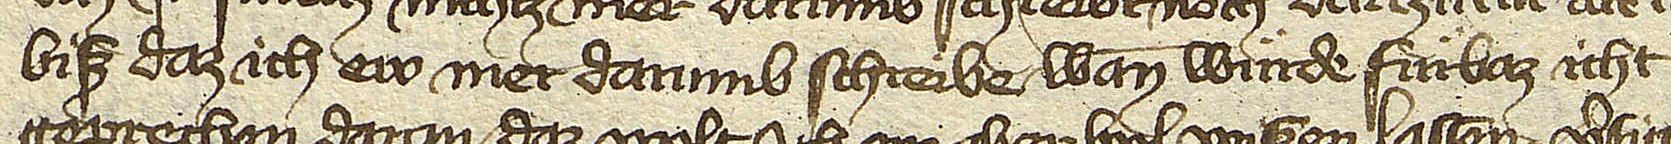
biſʒ daʒ ich ew mer darumb ſchreibe / wan* würde fürbaʒ icht
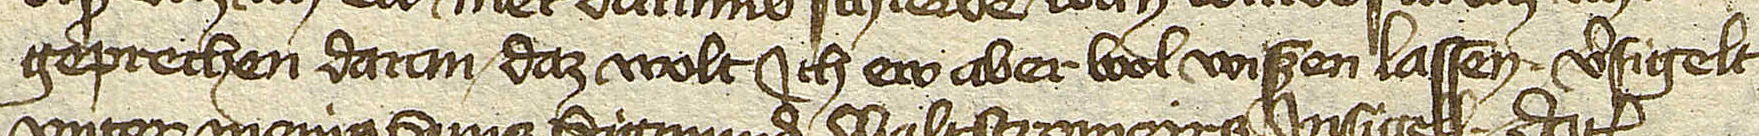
geprechen daran / daʒ wolt Ich ew aber wol wiſʒen laſſen . / v*ſigelt
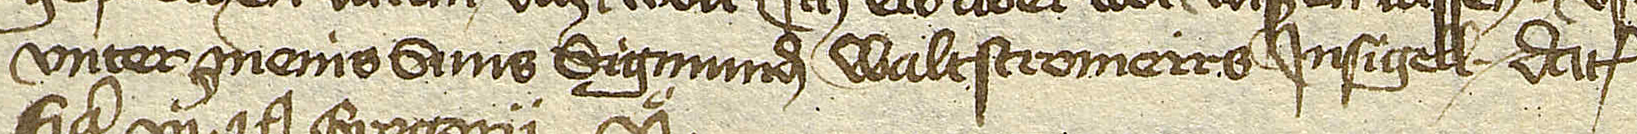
vnter meins Suns Sigmund* Waltſtromeirs Inſigell . / dat*
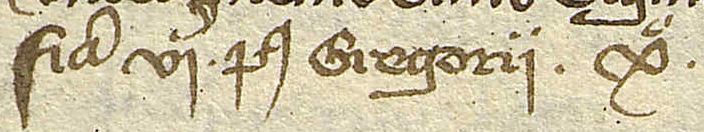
fia* vi* . p* Gregorii . x* .
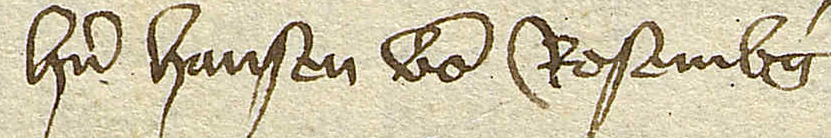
hn* hanſen vo* Roſembg*
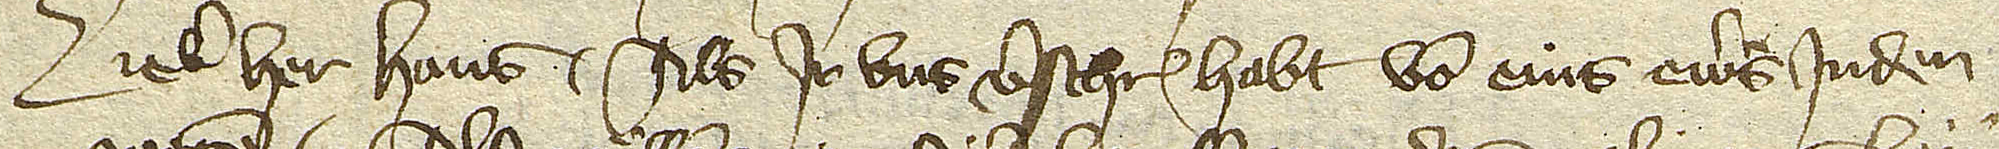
Lieb* her hans / Als Ir vns v*ſchr* habt vo* eins ew*s Iuden
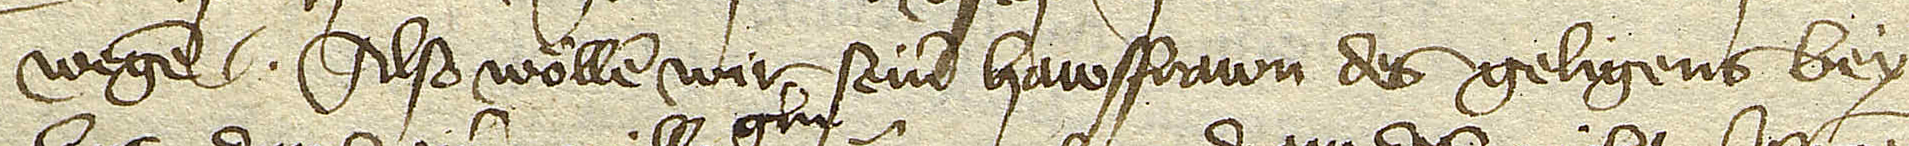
wege* / . Alſo wölle* wir ſein* hawſfrawn des geligens bey
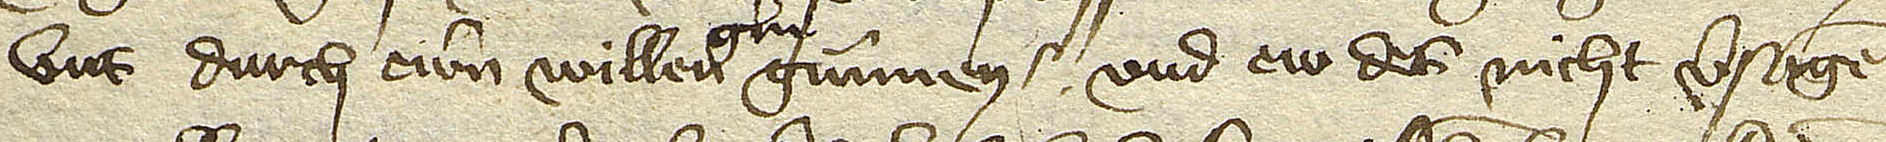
vns durch ewn* willen günnen / . vnd ew des nicht v*ſage*
